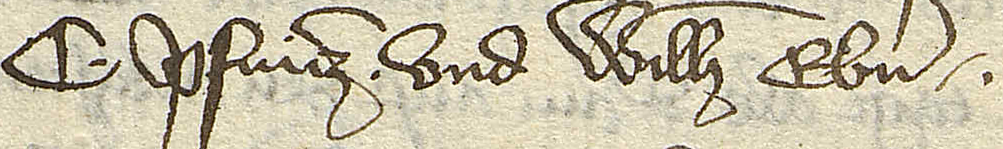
C. Pfincʒ* . vnd Wilh* Ebn* / .
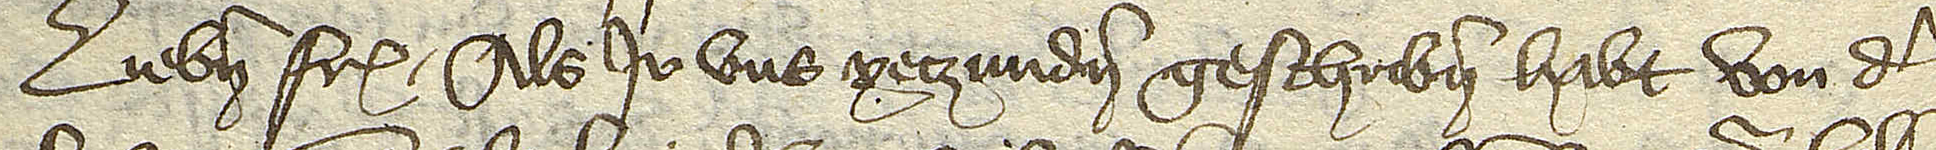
Liebn* fr* / Als Ir vns yecʒundn* geſchribn* habt von d*
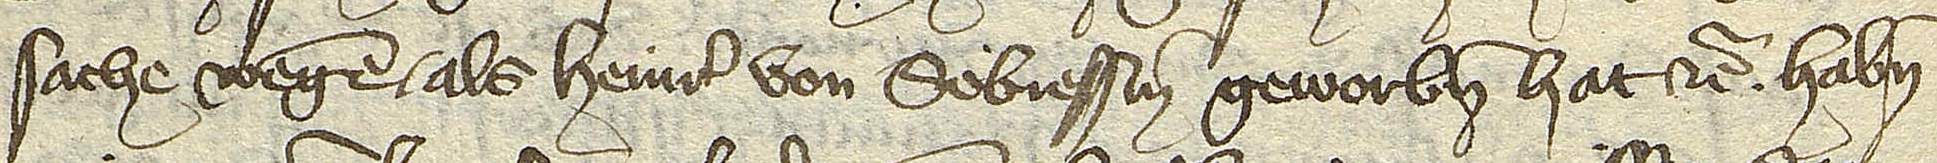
ſache wege* / als heinr* von Sobreſſin* geworbn* hat ec* . habn*
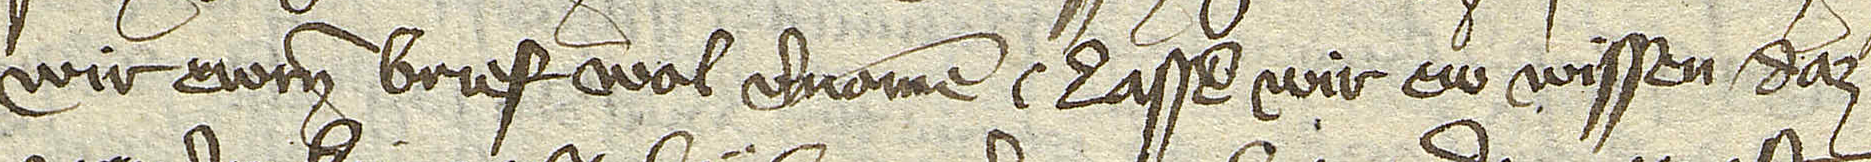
wir ewr*n brief wol v*nome* / Laſſe* wir ew wiſſen / daʒ
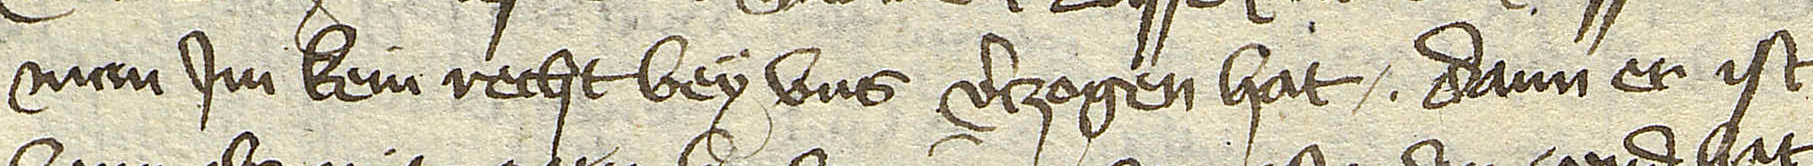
man Im kein recht bey vns v*cʒogen hat / . Dann er iſt
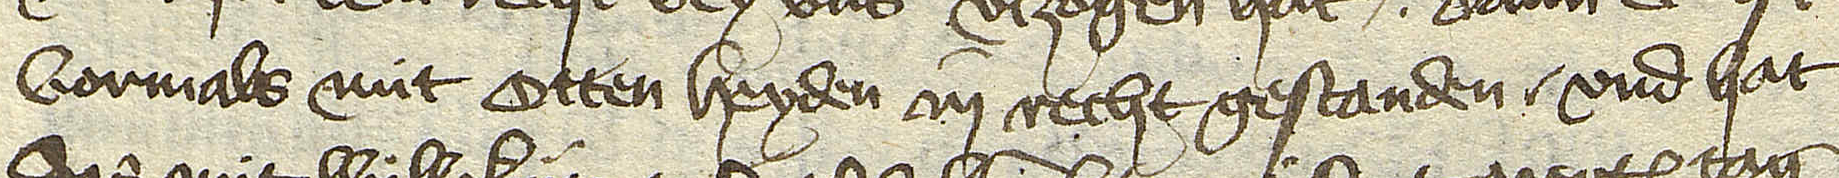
vormals mit Otten heyden in recht geſtanden / vnd hat
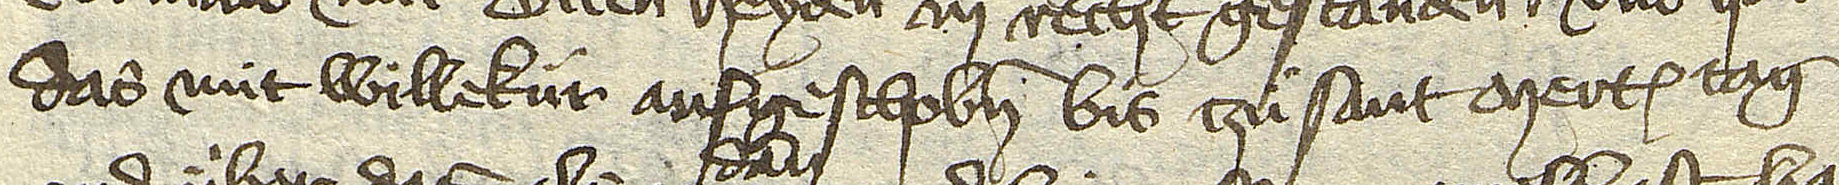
das mit willekür aufgeſchobn* bis cʒü ſant Mert* tag
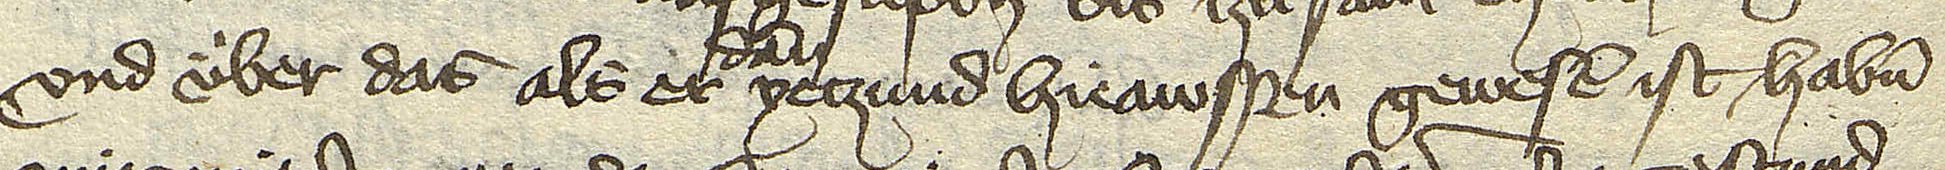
vnd v̈ber das als er yecʒund hieawſſen geweſe* iſt / habn*
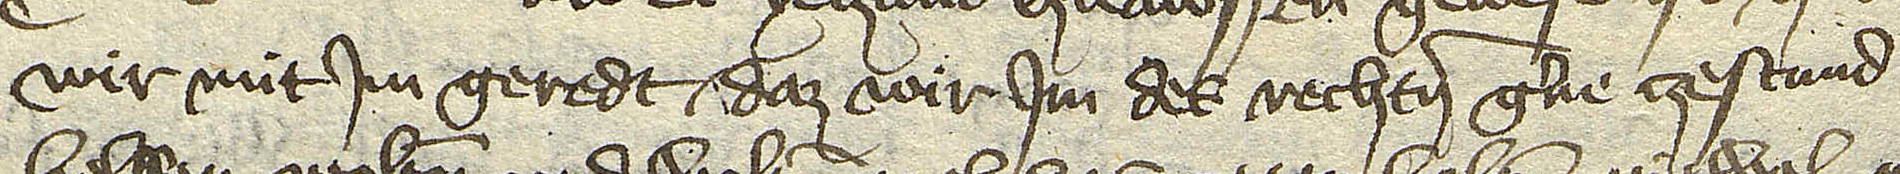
wir mit Im geredt / daʒ wir Im des rechtn* g*ne cʒeſtund
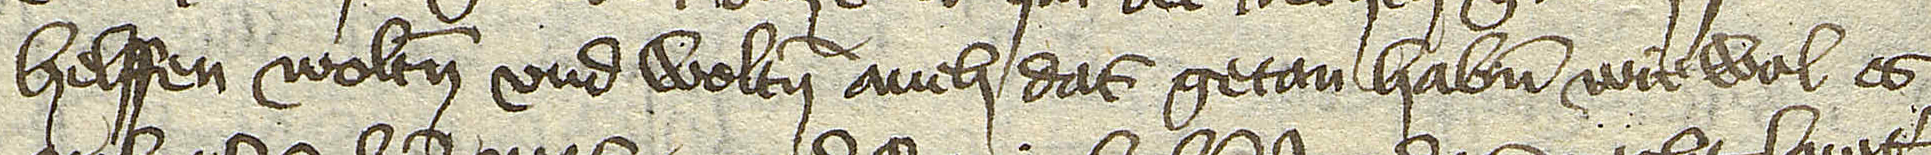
helffen woltn* vnd woltn* auch das getan habn* wie wol es
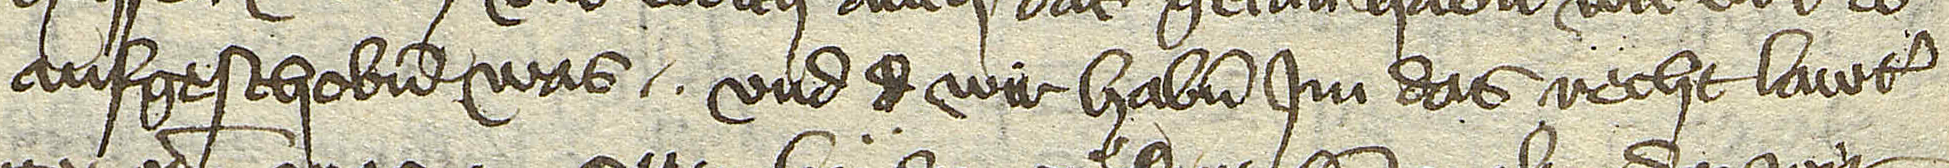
aufgeſchobn* was / . vnd d wir habn* Im das recht lawt*
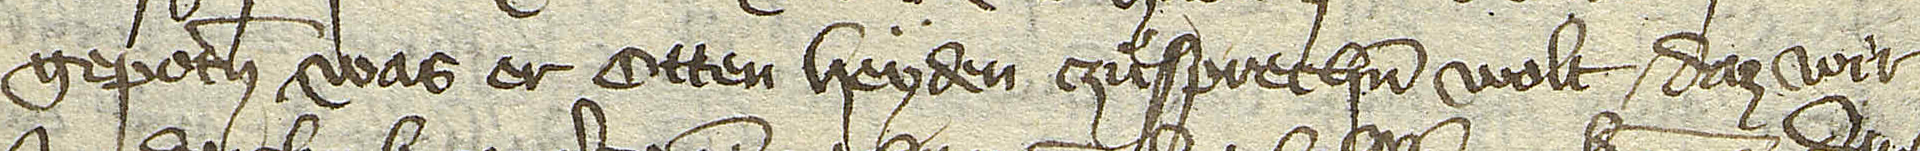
gepotn* / was er Otten heyden cʒüſprechn* wolt /. daʒ wir
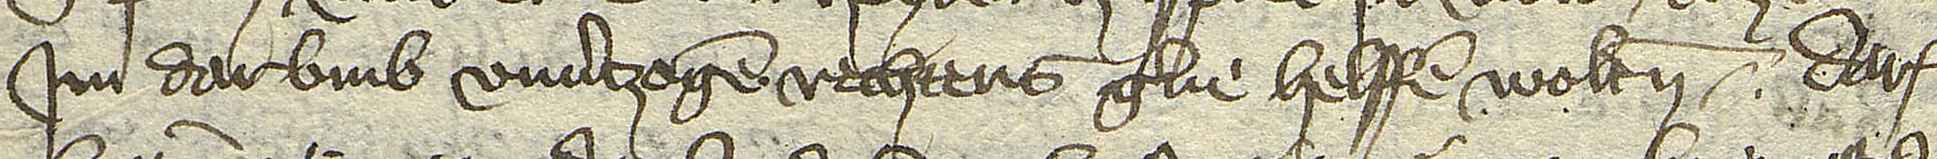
Im darvmb vnu*cʒoge* rechtens g*ne helffe* woltn* / . dar*
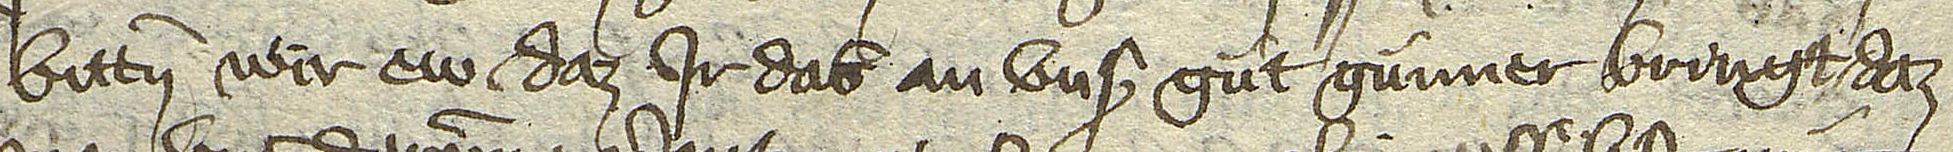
bittn* wir ew / daʒ Ir das an vnſ* güt günner bringt / daʒ
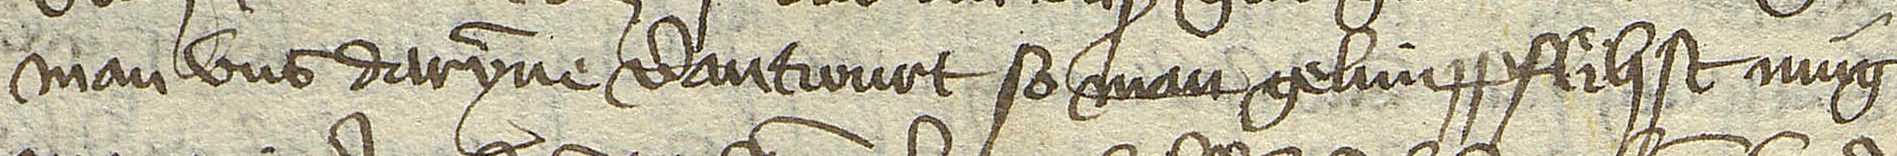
man vns daryne* v*antwurt ſo man gelimppflihſt müg
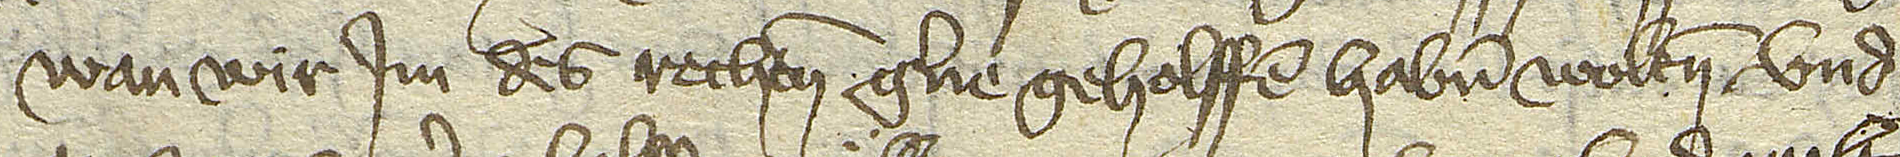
wan wir Im des rechtn* g*ne geholffe* habn* woltn* / vnd
